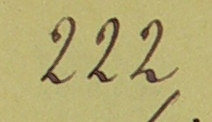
222
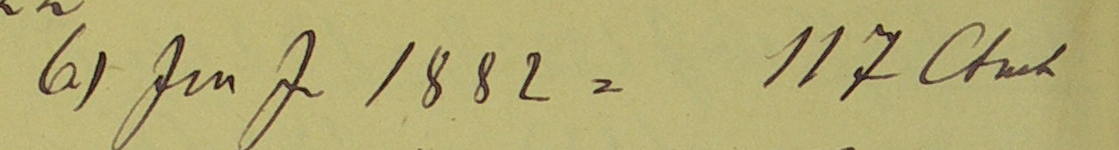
6) 1882 = 117 ctmtr
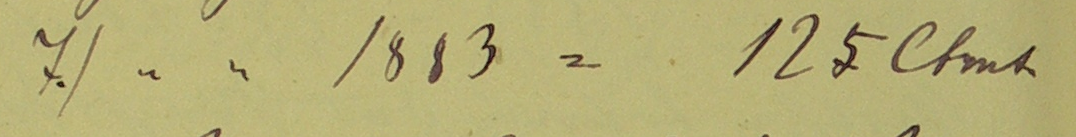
7) 1883 = 125 cmtr
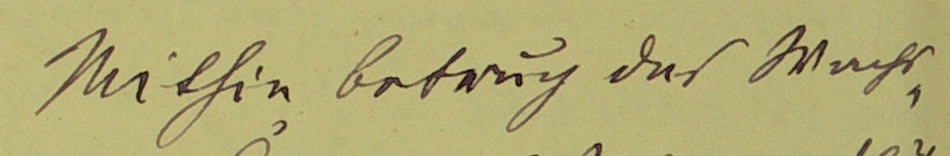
Mithin betrug das Wach¬
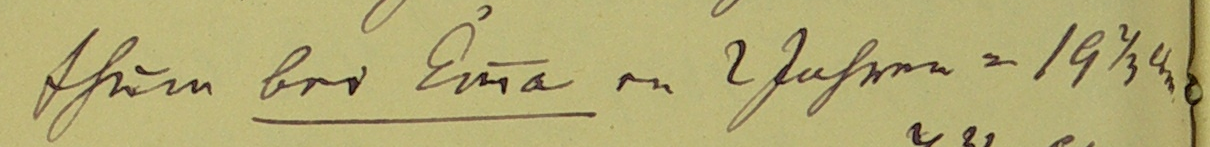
stum bei Emma in 2 Jahren 14 ¾ ctmtr
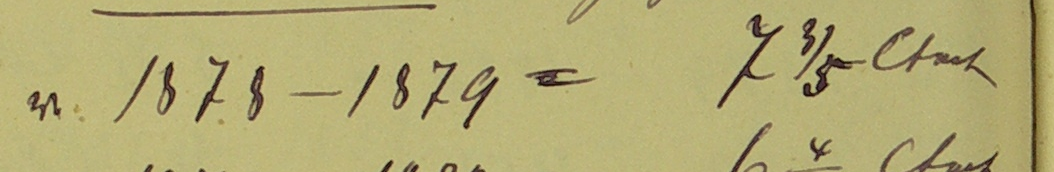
Von 1878-1879 = 7 3/5 cmtr
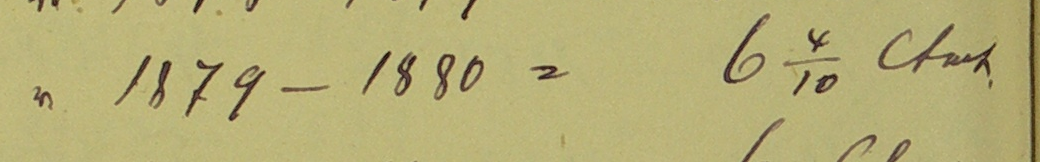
1879-1880 = 6 4/10 cmtr
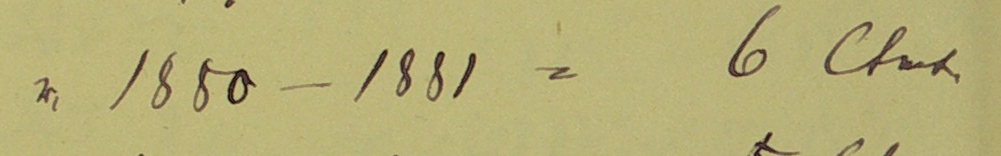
1880-1881 = 6 cmtr
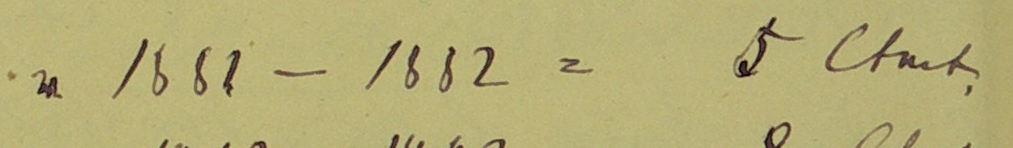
1881-1882 = 5 cmtr
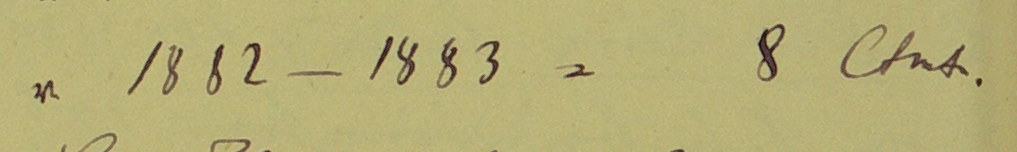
1882-1883 = 8 cmtr
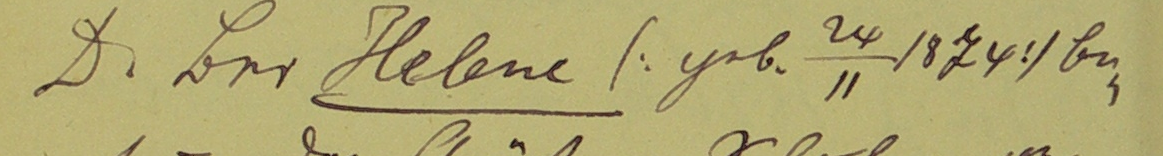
C) Bei Helene (: 24/11 1874 :) be¬
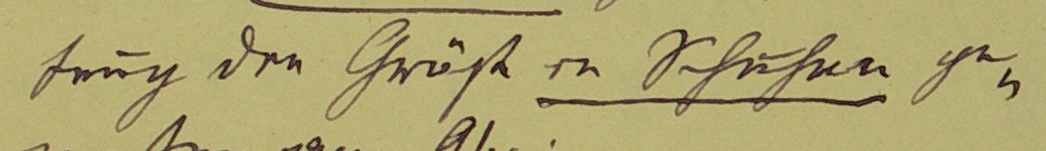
trug die Größe in Schuhen ge¬
